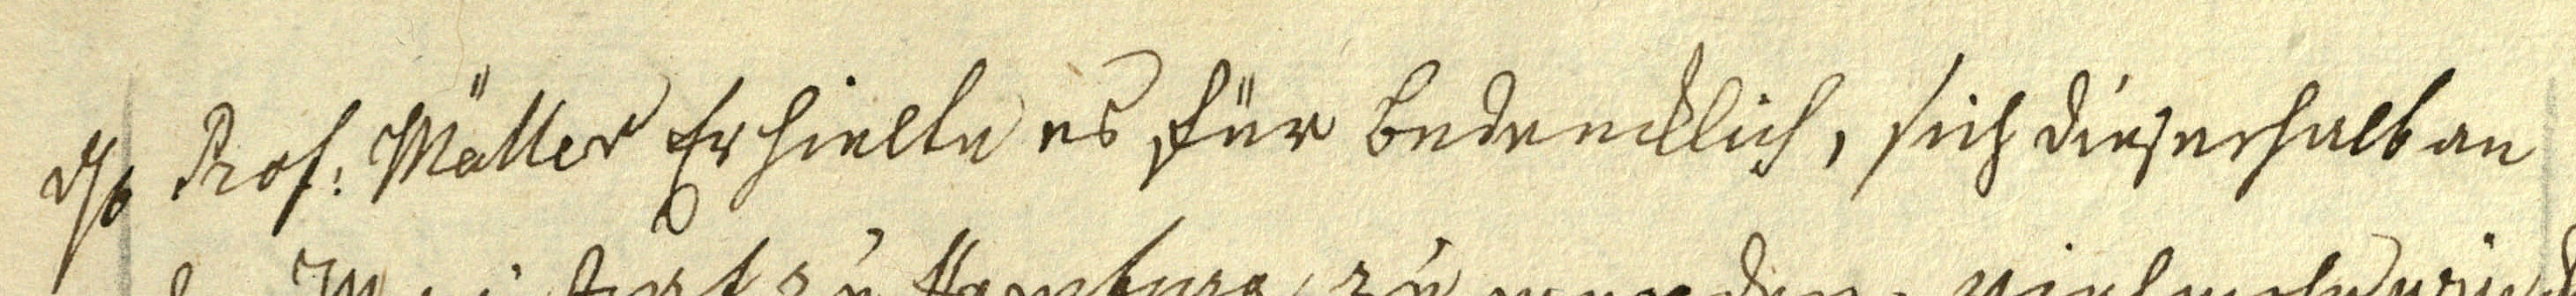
dh Prof. Möller Er hielte es für bedenklich, sich dieserhalb an
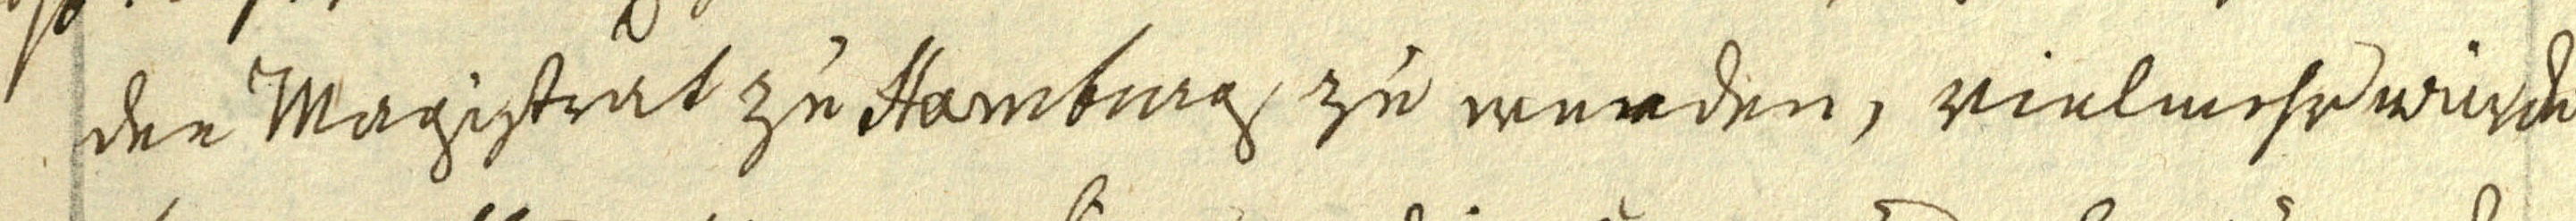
den Magistrat zu Hamburg zu wenden, vielmehr würde
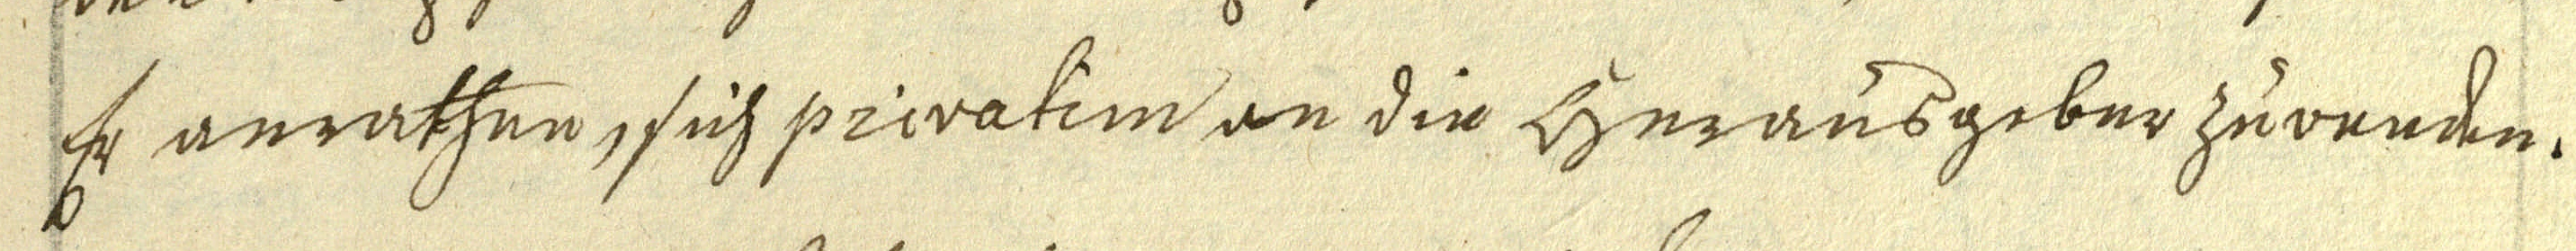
Er anrathen, sich privatim an die Herausgeber zu wenden.
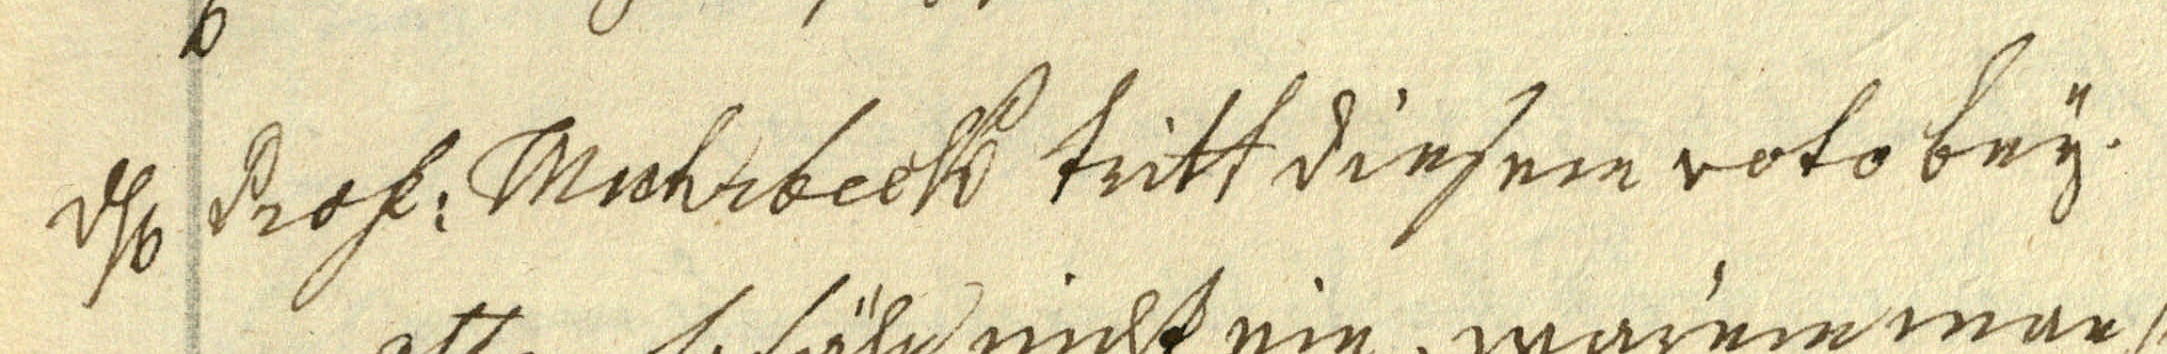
dh Prof. Muhrbeck tritt diesem voto beÿ.
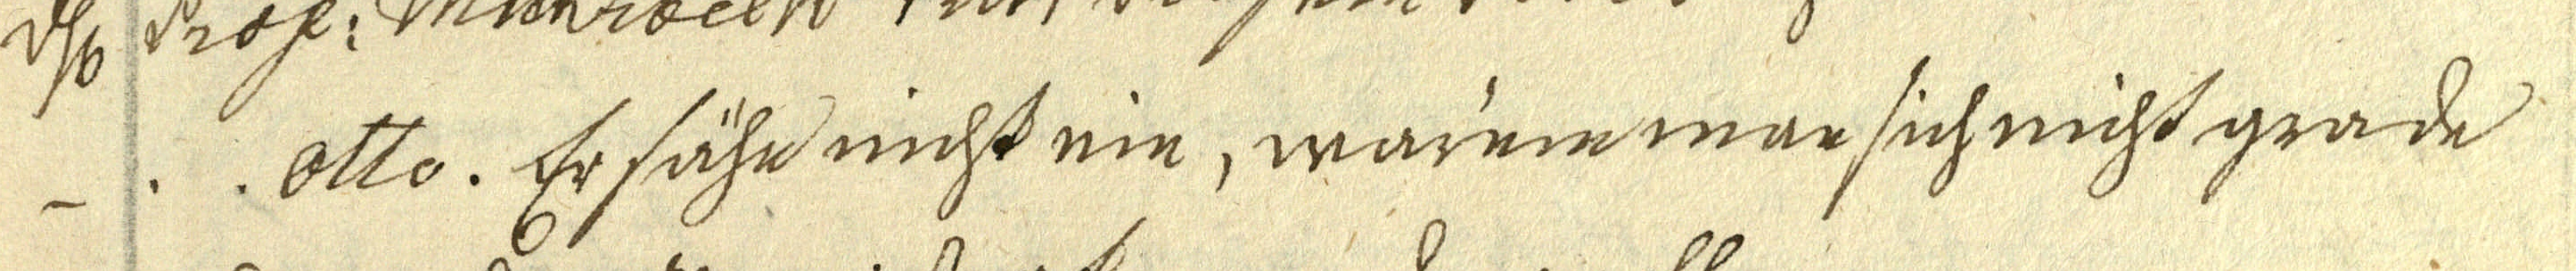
Otto. Er sähe nicht ein, warum man sich nicht grade
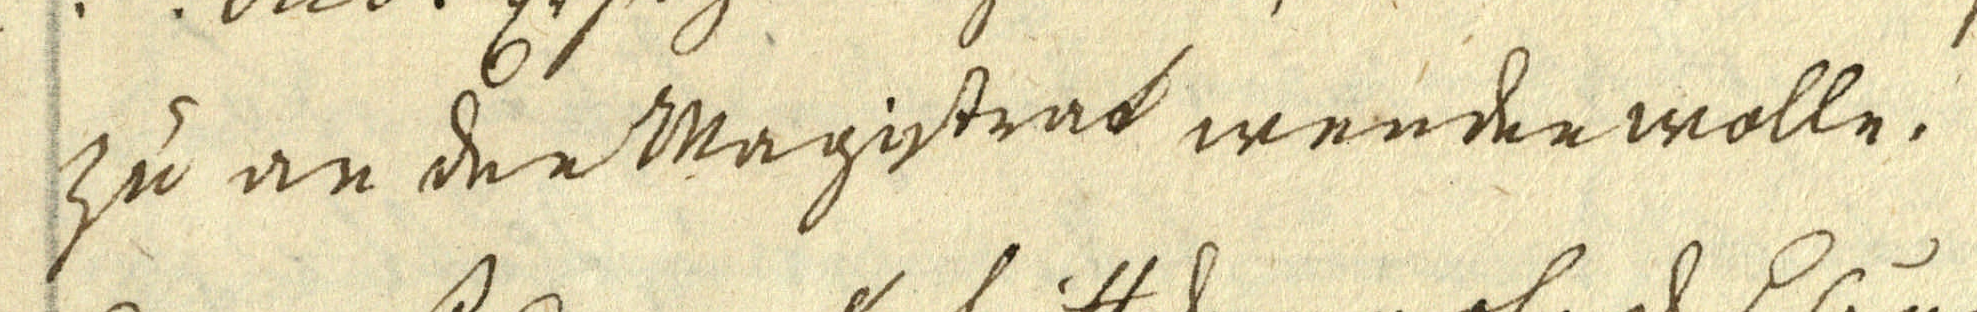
zu an den Magistrat wenden wolle.
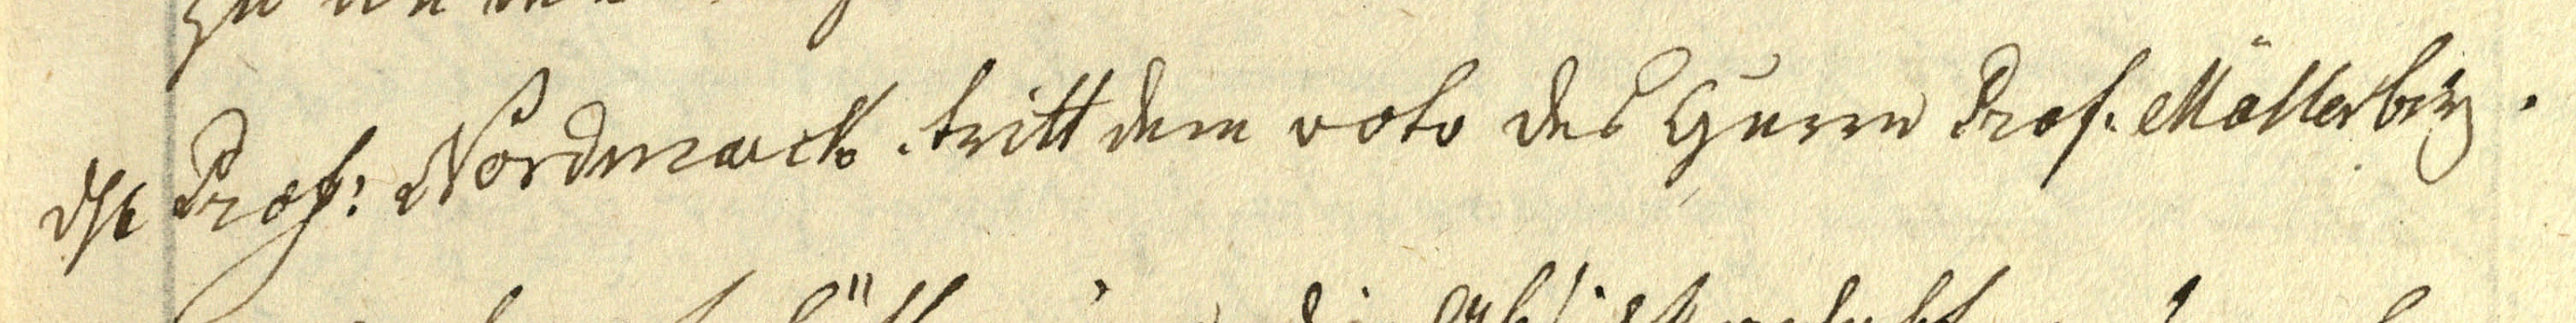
dh Prof. Nordmarck. tritt dem voto des Herrn Prof Möller beÿ.
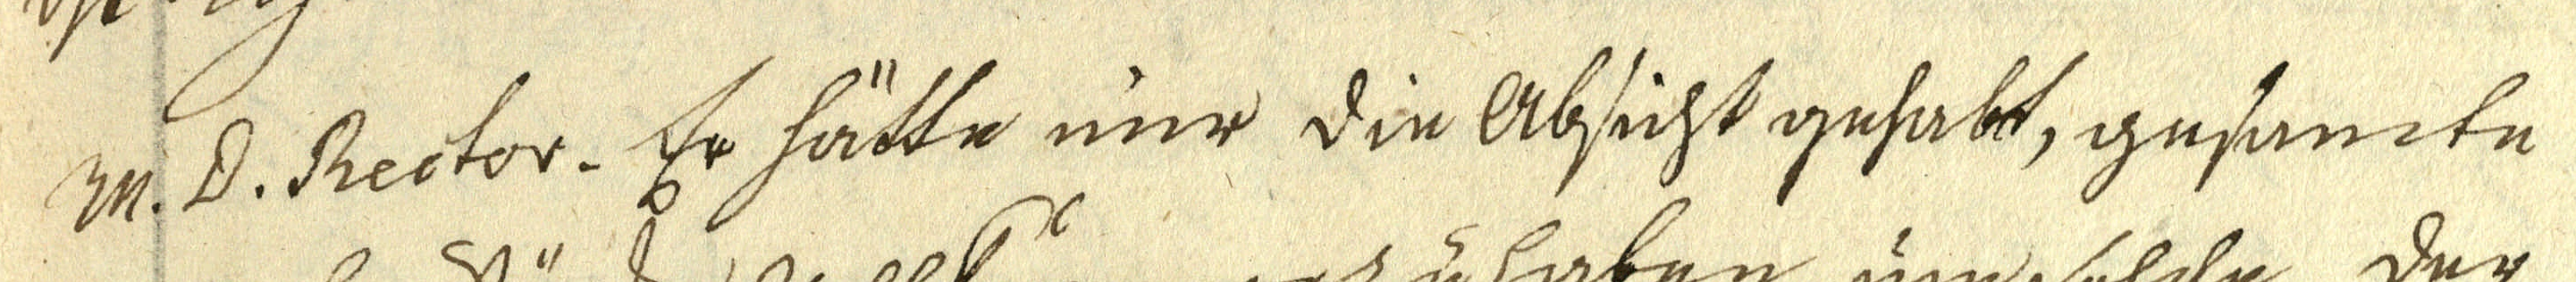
M. D. Rector. Er hätte nur die Absicht gehabt, gesamte
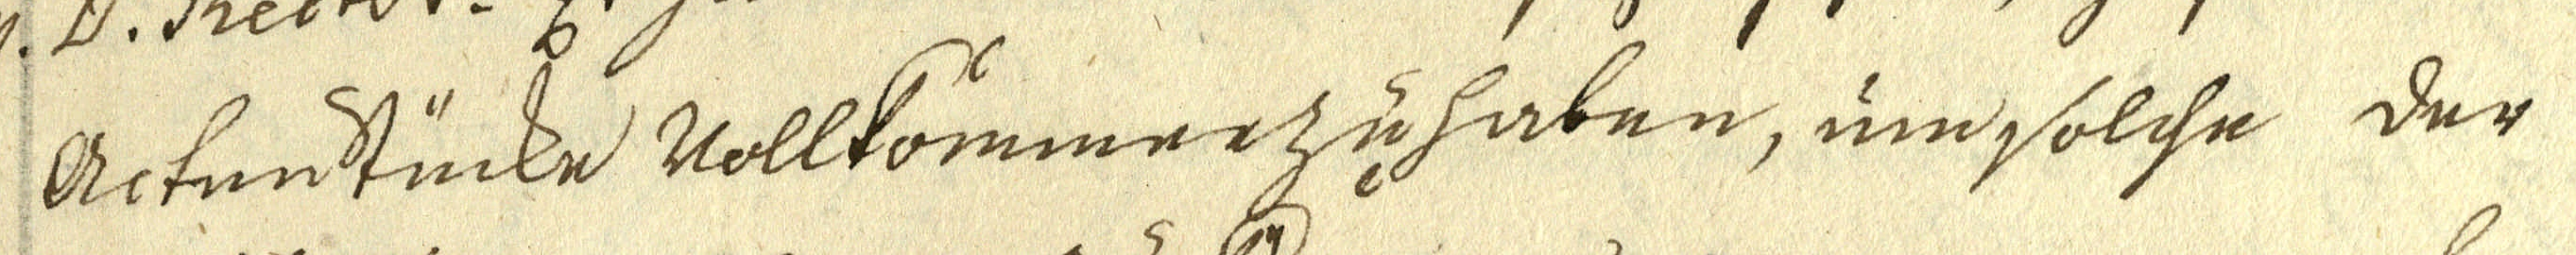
Actenstücke vollkommen zuhaben, um solche der
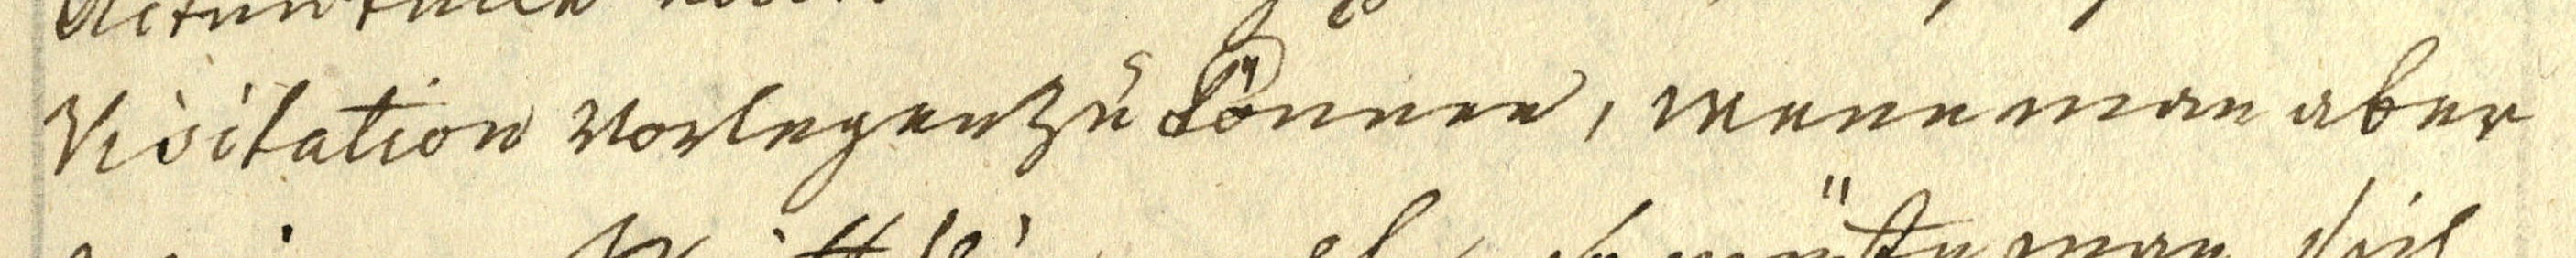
Visitation vorlegen zu können, wenn man aber
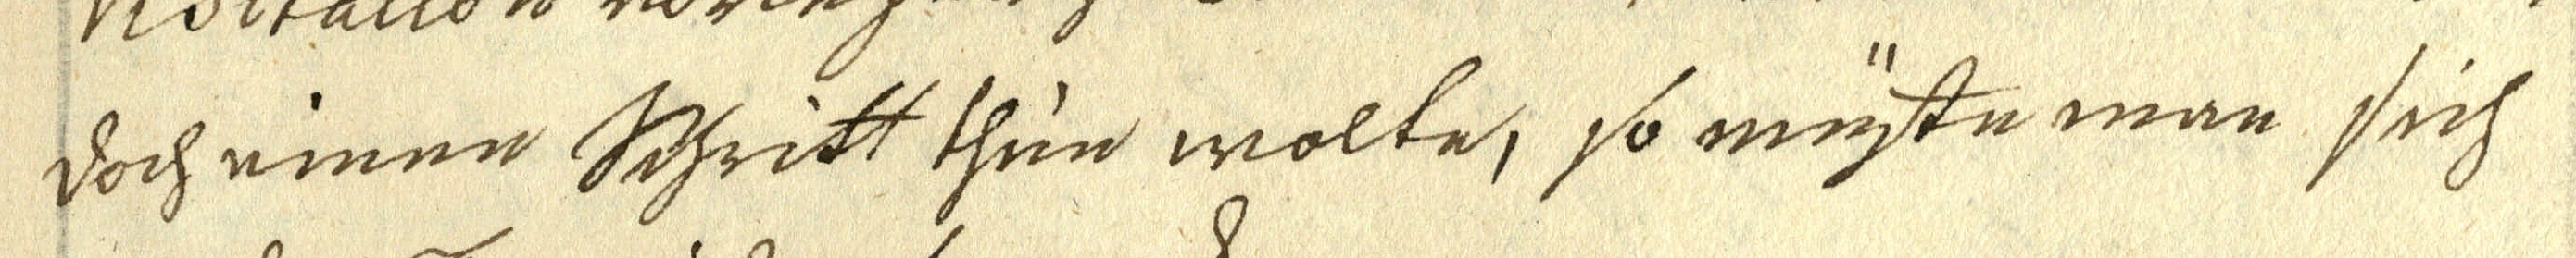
doch einen Schritt thun wolte, so müste man sich
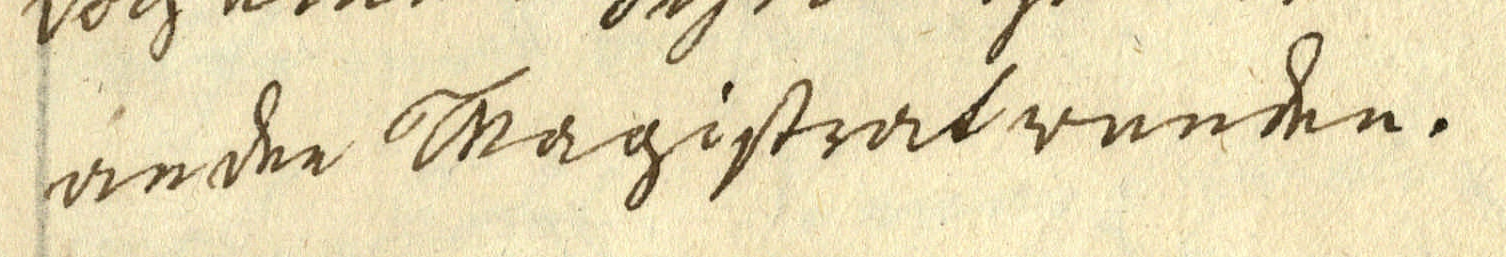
an den Magistrat wenden.
